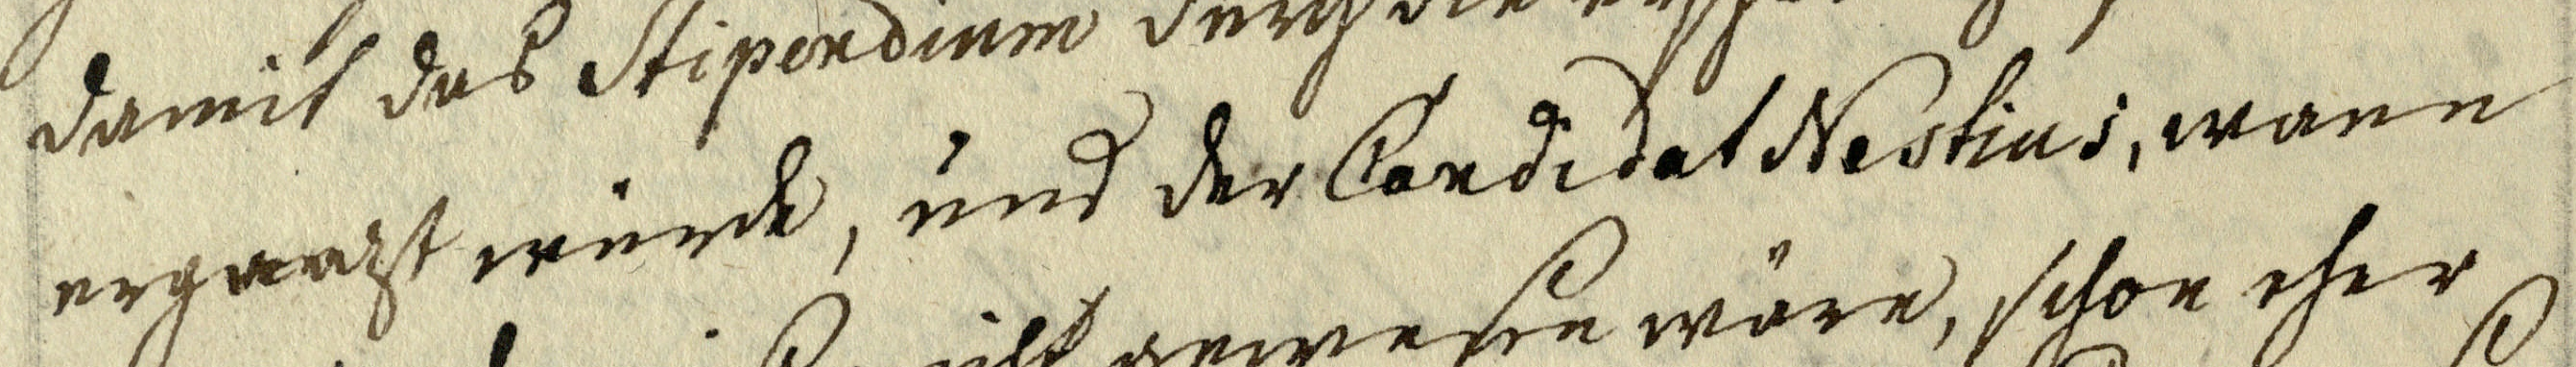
erganzt würde, und der Candidat Nestius, wann
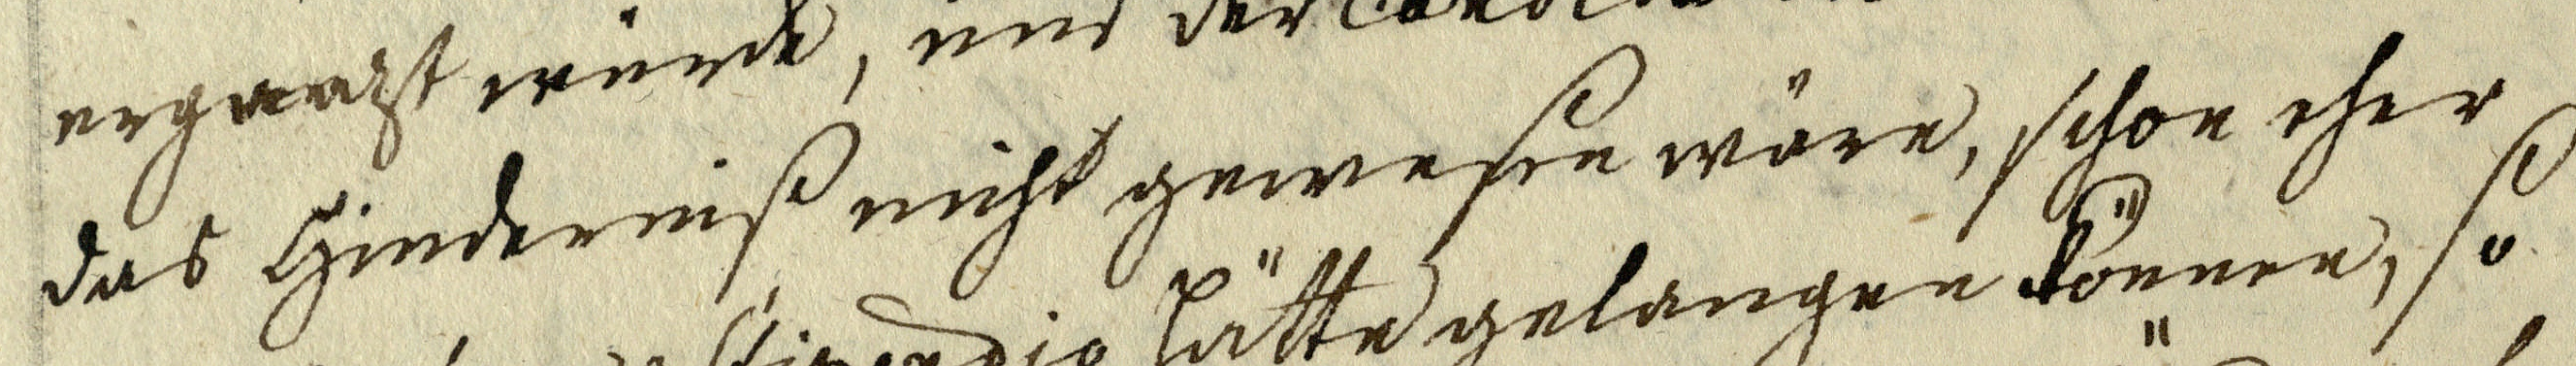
das Hinderniß nicht gewesen wäre, schon eher
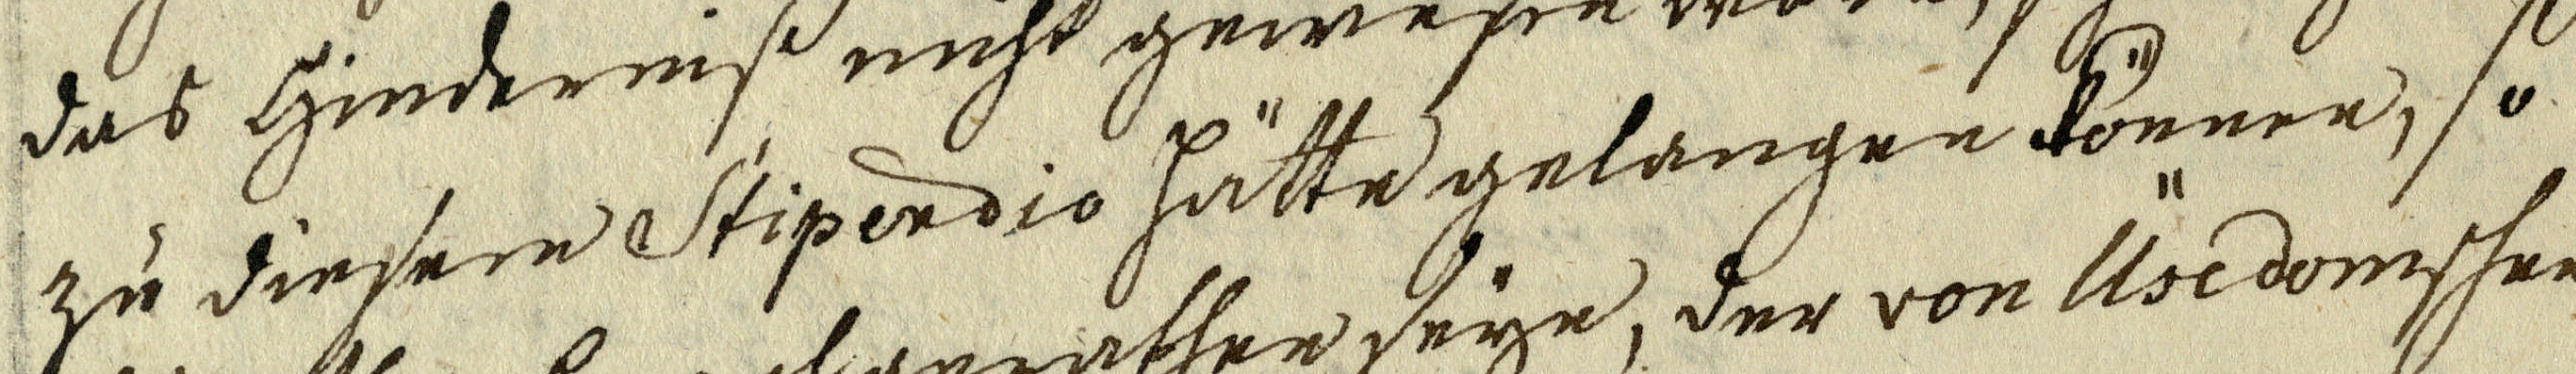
zu diesem Stipendio hätte gelangen können, so
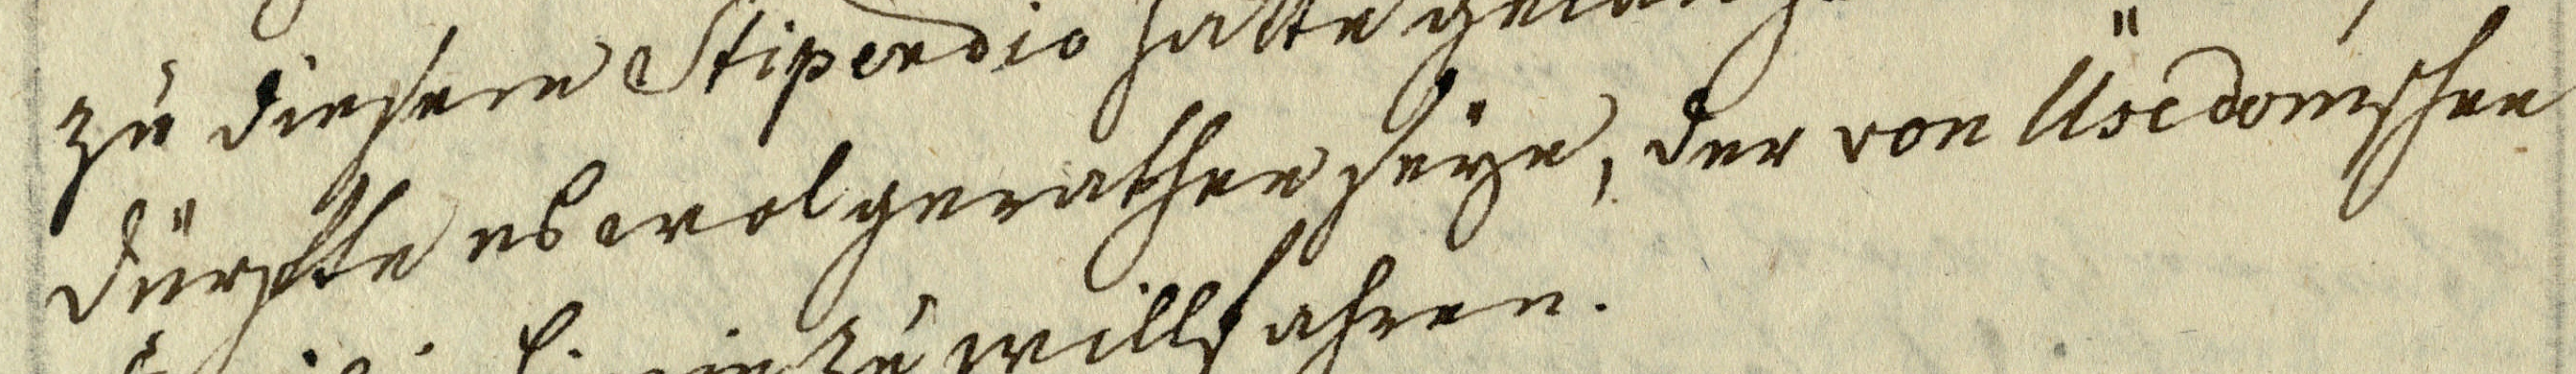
dürfte es wol gerathen seÿn, der von Üsedomschen
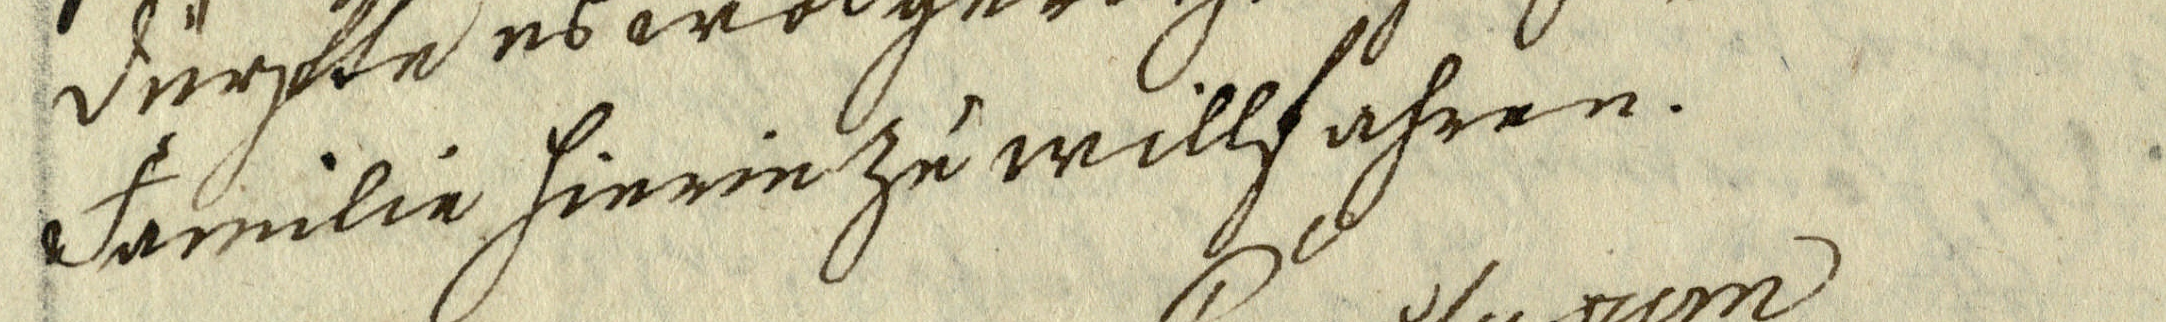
Familie hierin zu willfahren.
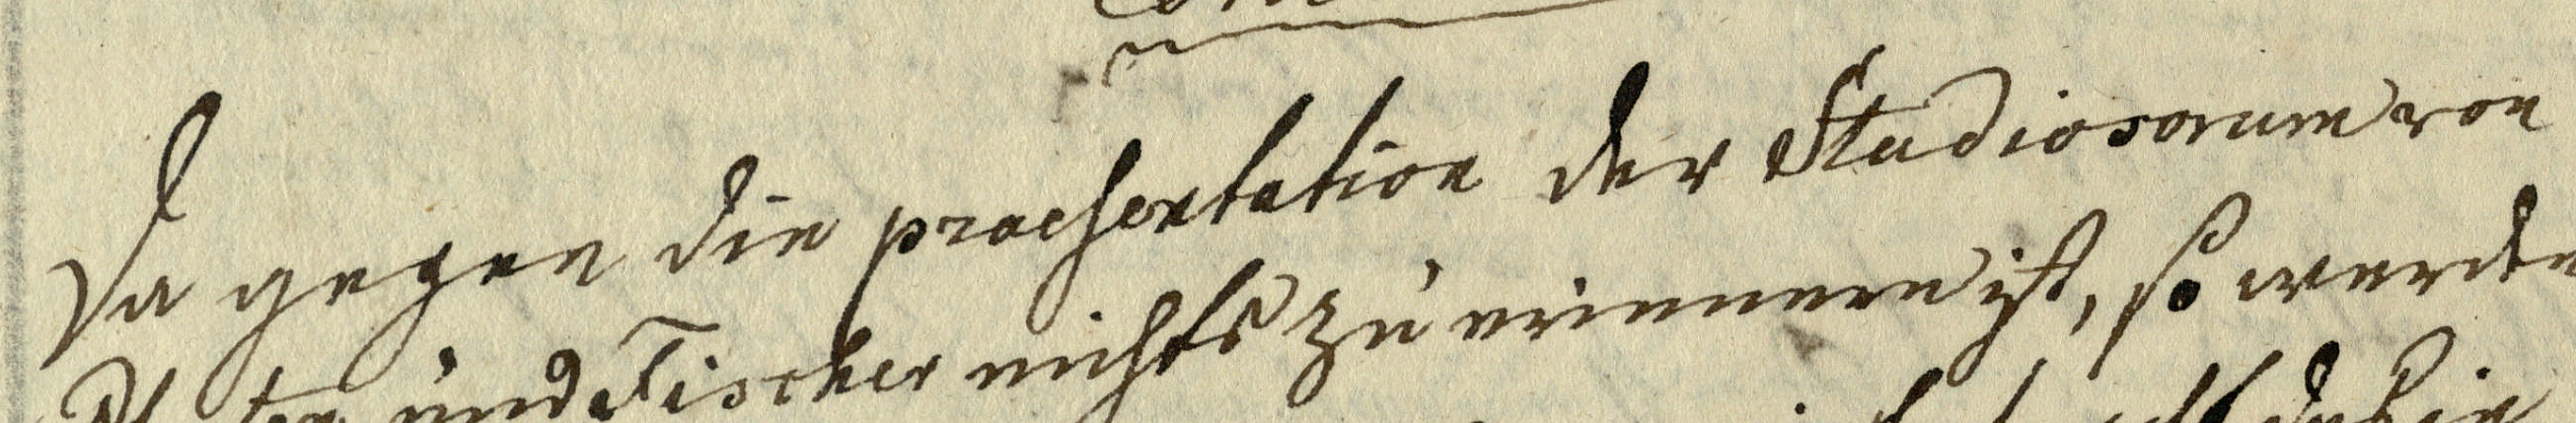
Da gegen die praesentation der Studiosorum von
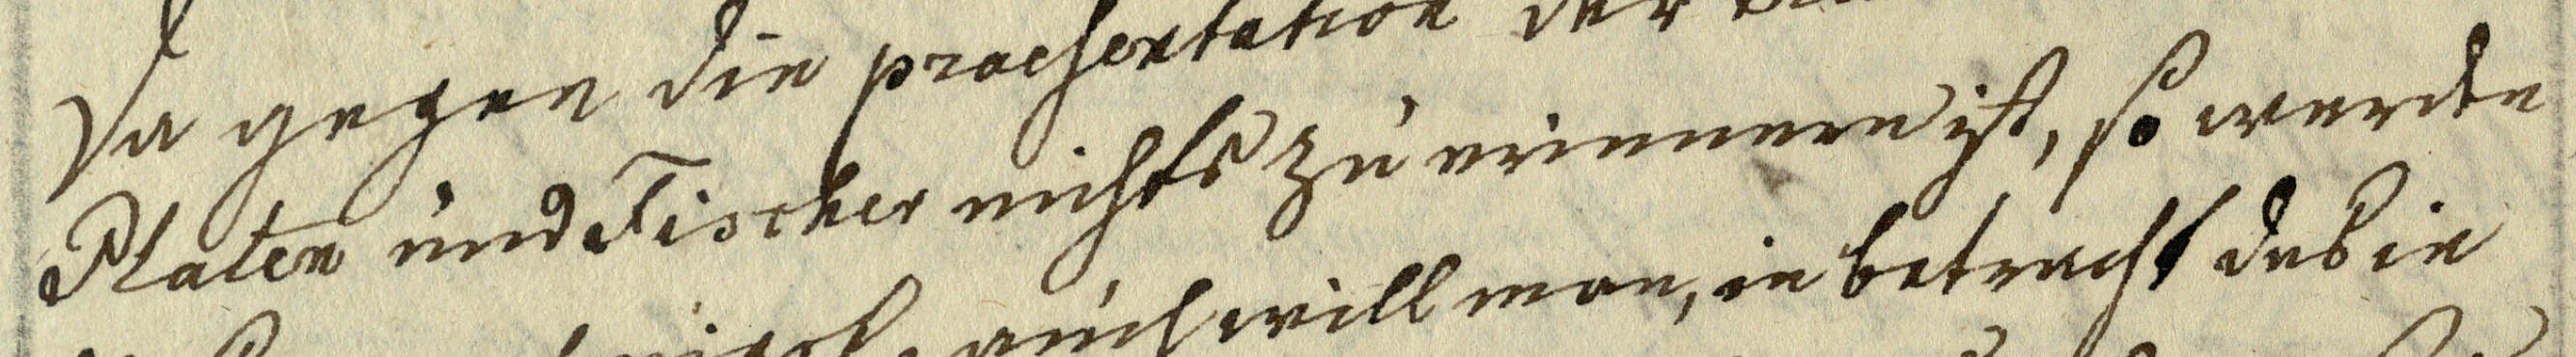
Platen und Fischer nichts zu erinnern ist, so werden
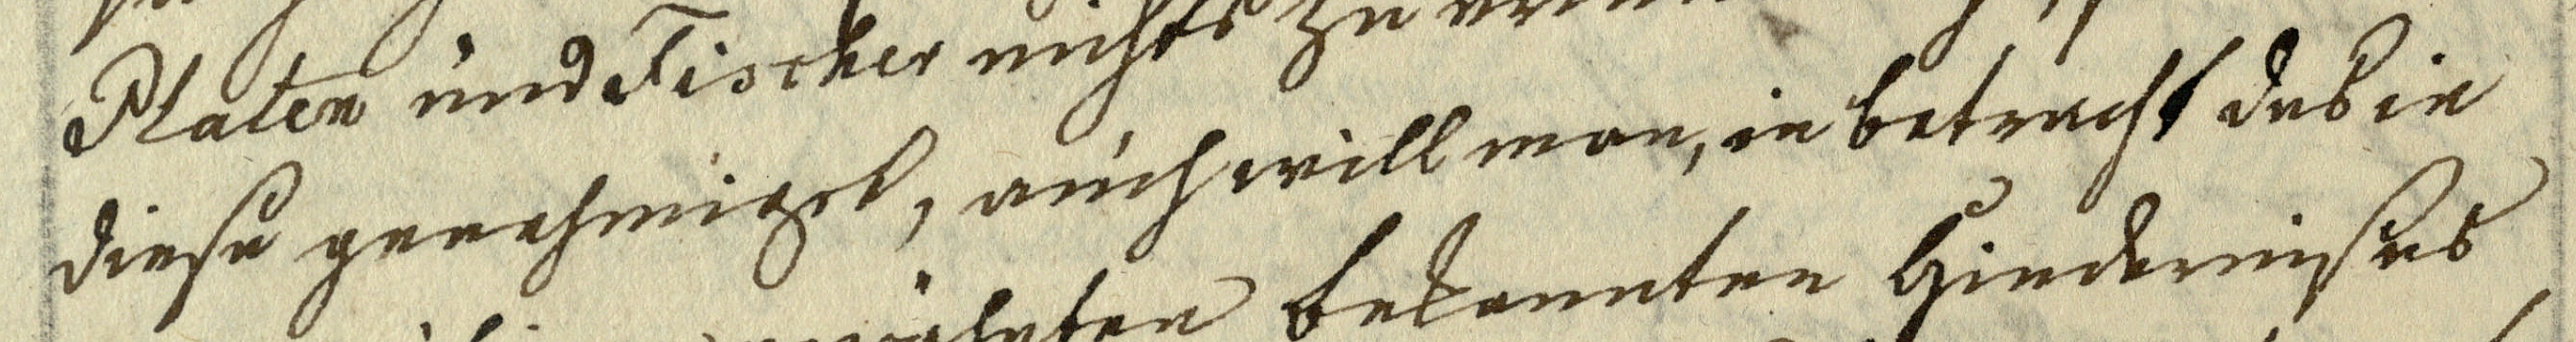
diese genehmiget, auch will man, in betracht das in
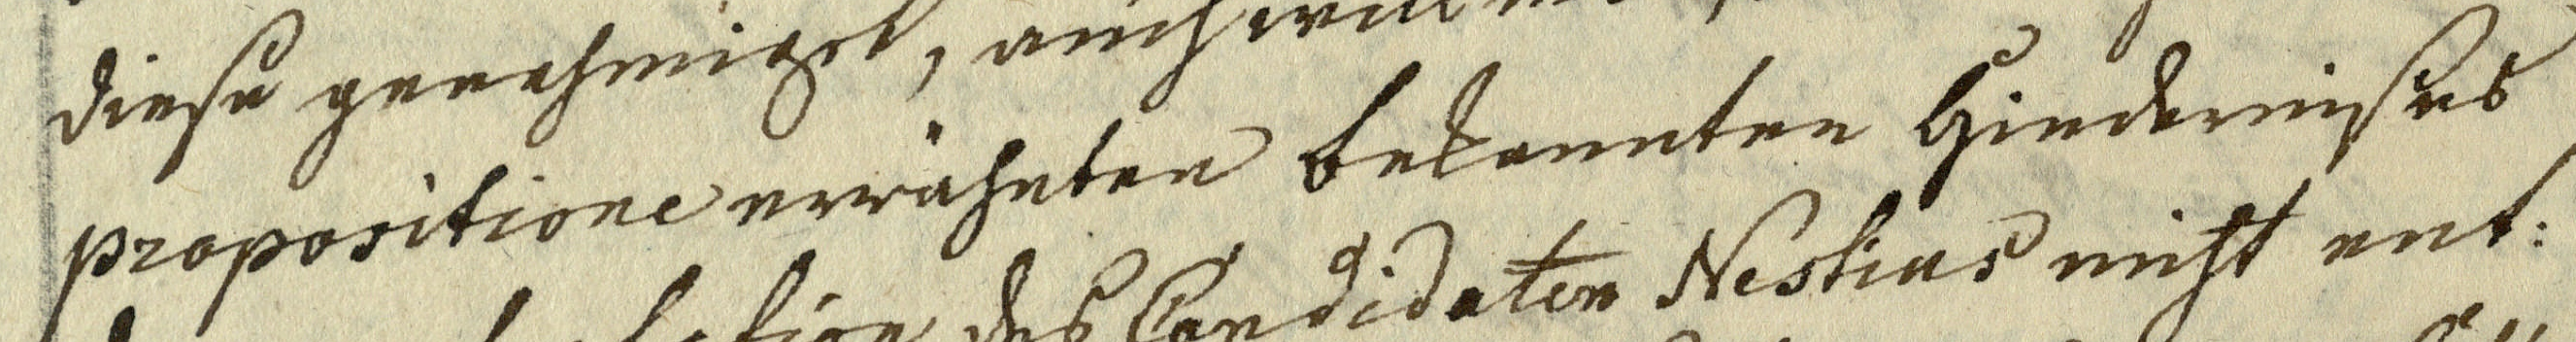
propositione erwähnten Bekannten Hindernißes
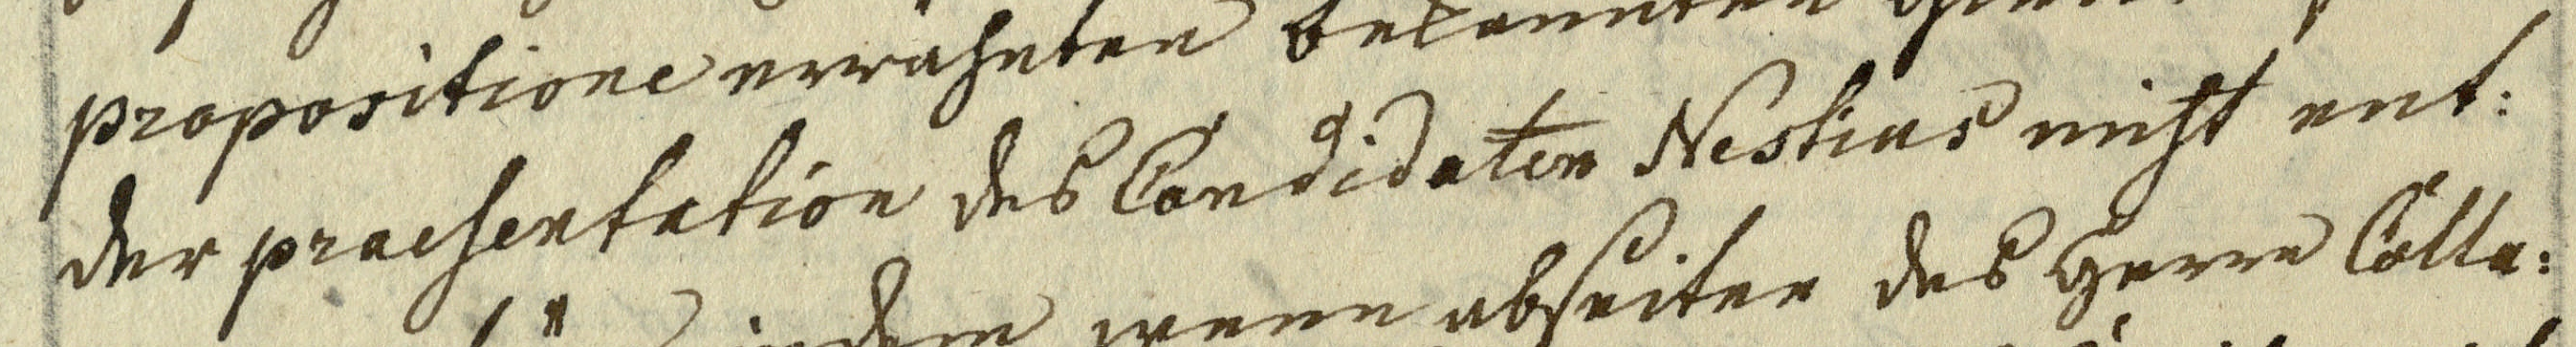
der praesentation des Candidaten Nestius nicht ent¬
